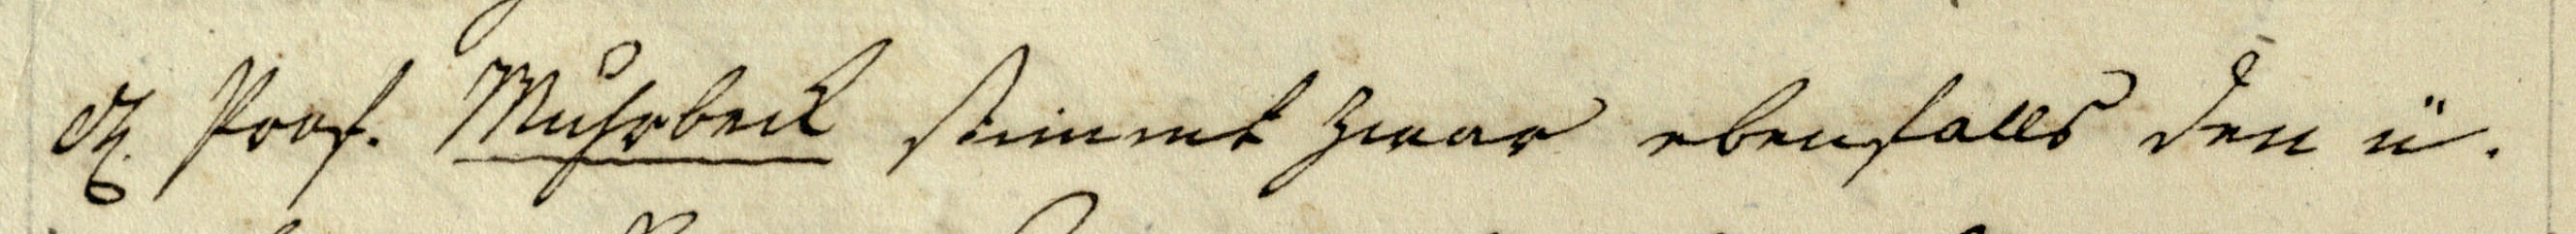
dh. Prof. Muhrbeck stimmt zwar ebenfalls den ü¬
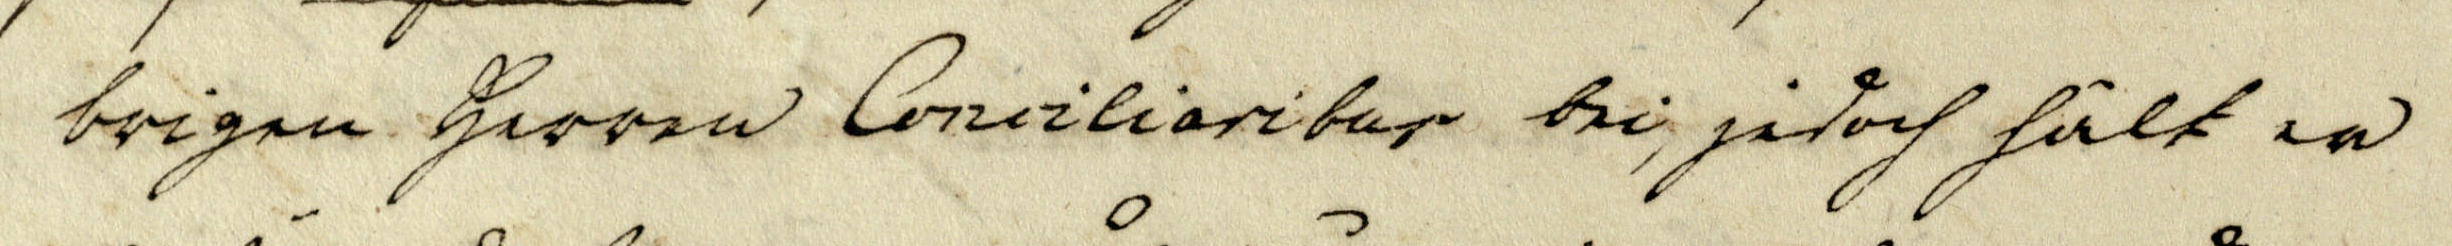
brigen Herren Conciliaribus bei, jedoch hält er
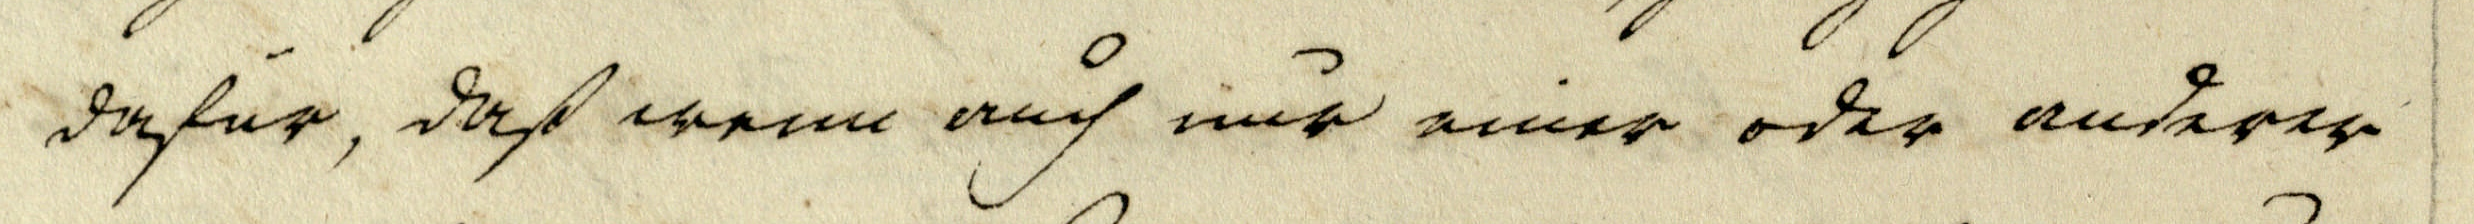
dafür, daß wenn auch nur einer oder anderer
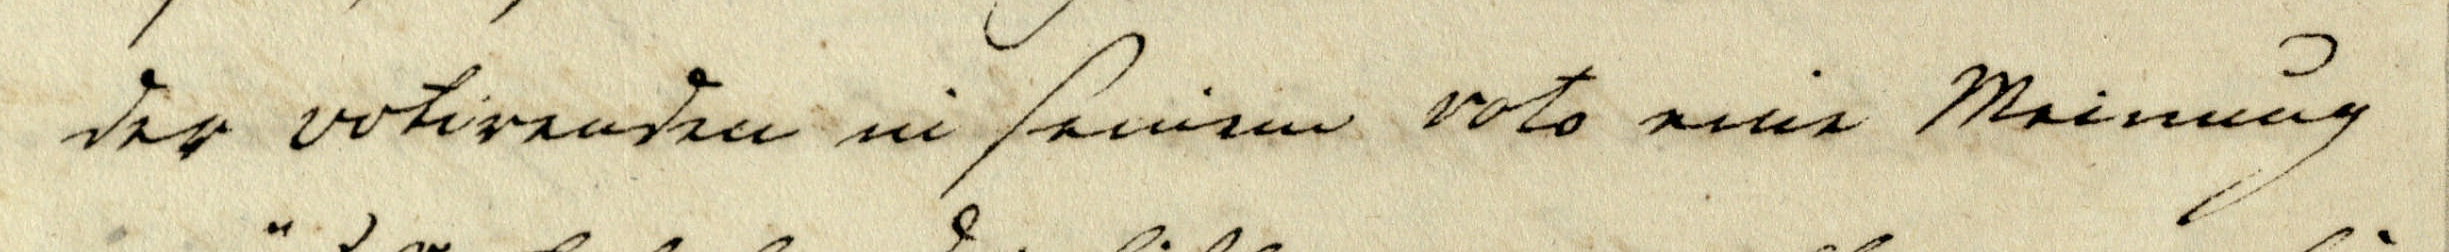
der votirenden in seinem voto eine Meinung
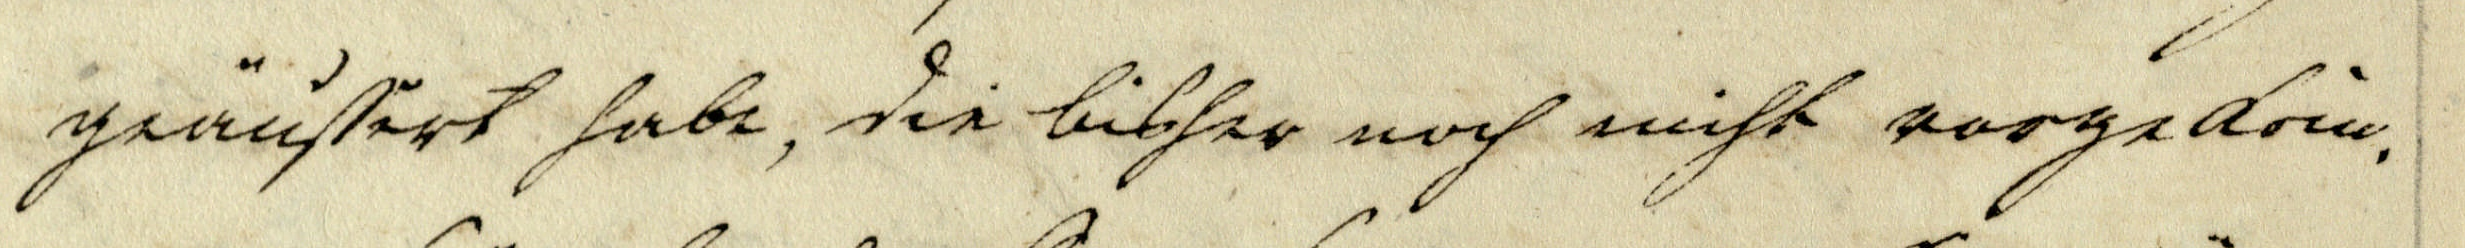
geäussert habe, die bisher noch nicht vorgekom¬
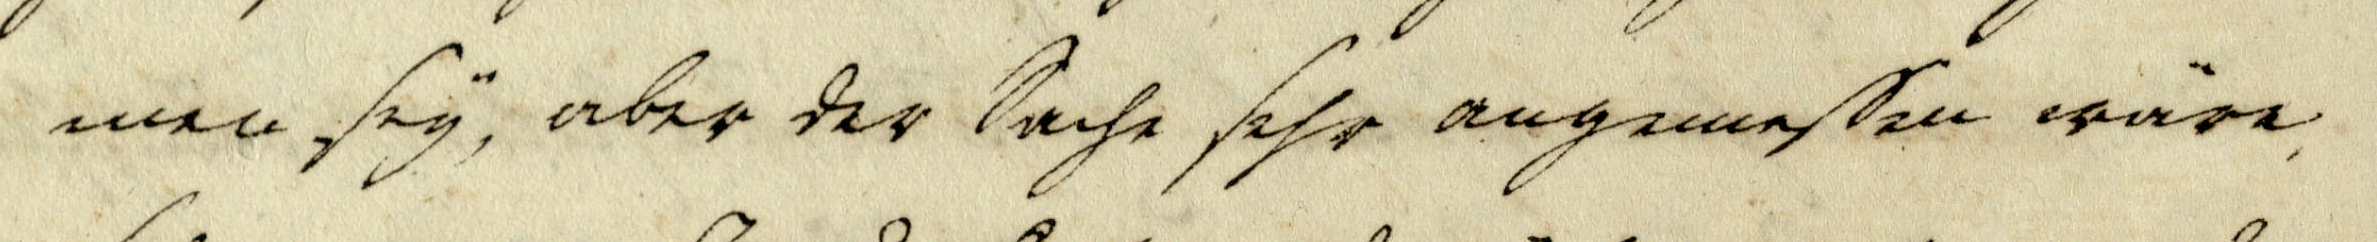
nen seÿ, aber der Sache sehr angemessen wäre,
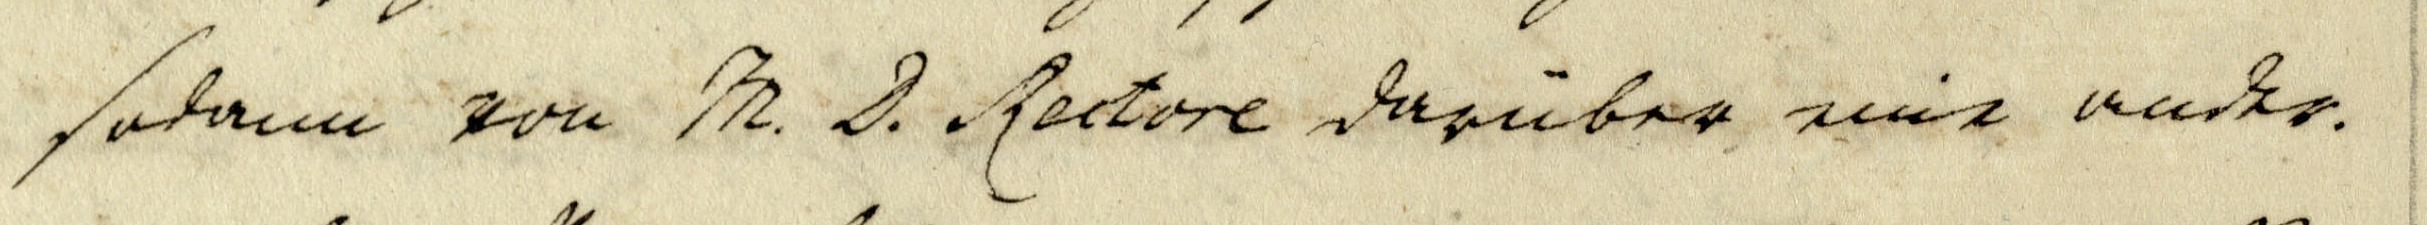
sodann von M. D. Rectore darüber eine ander¬
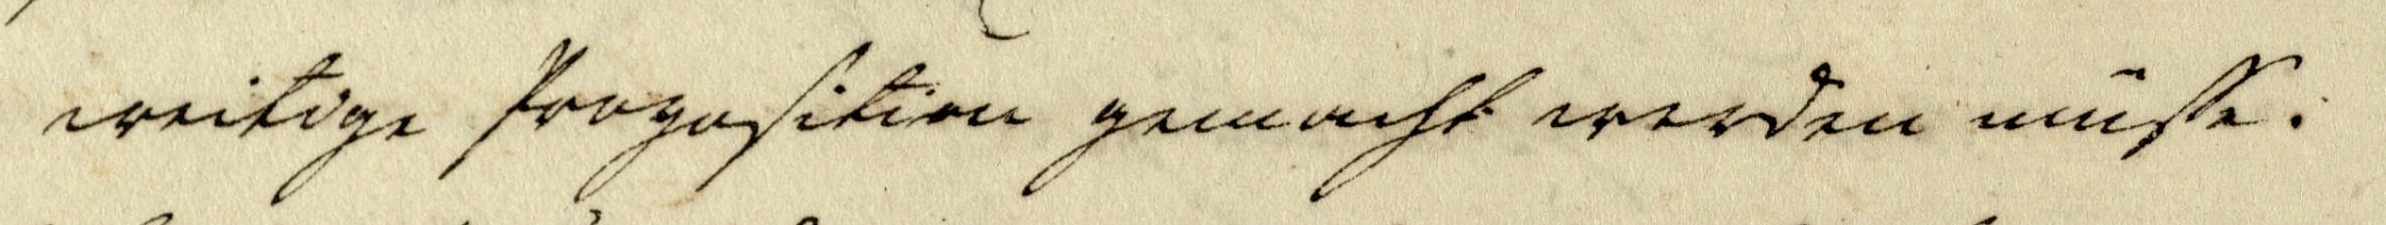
weitige Proposition gemacht werden müsse.
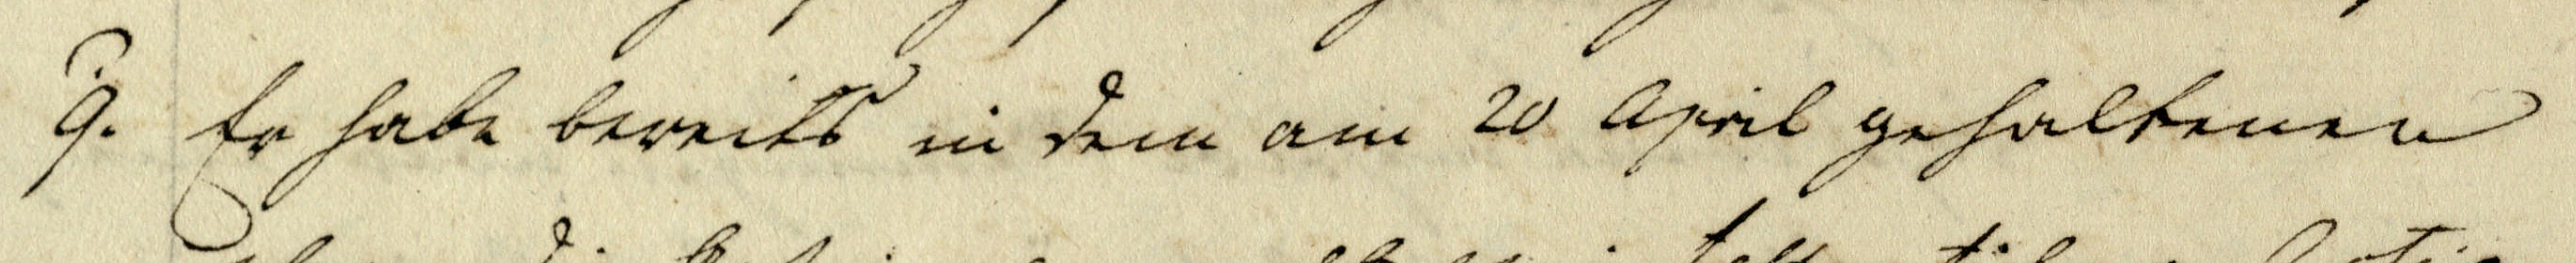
9. Er habe bereits in dem am 20. April gehaltenen
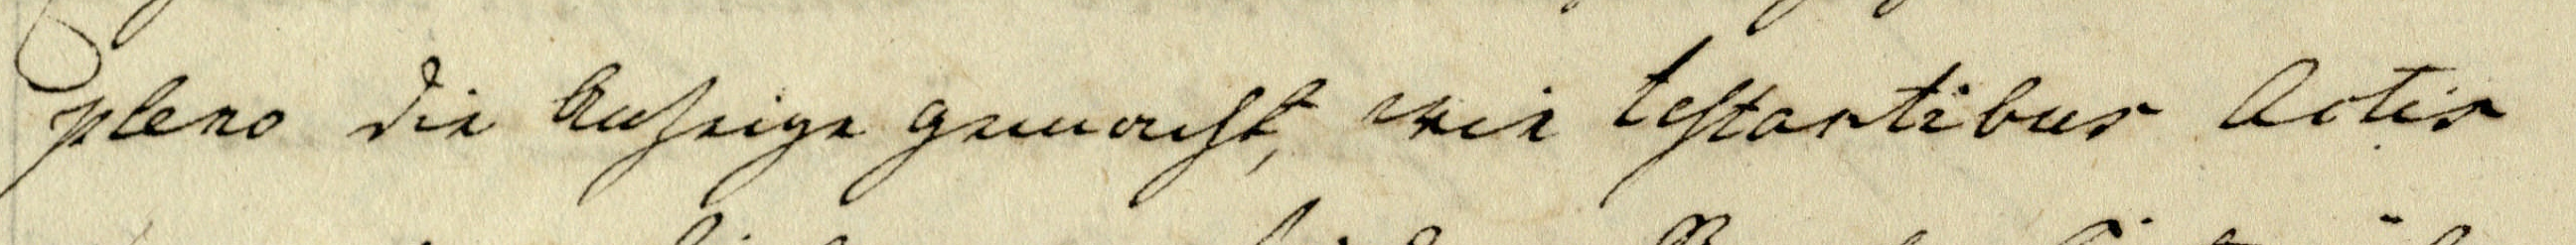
pleno die Anzeige gemacht, wie testantibus Actis
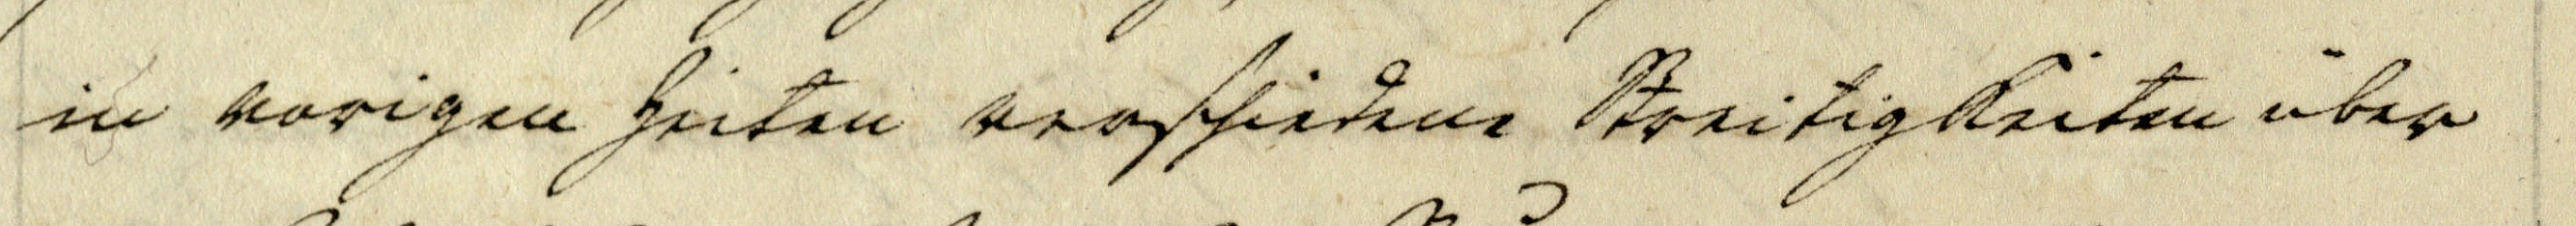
in vorigen Zeiten verschiedene Streitigkeiten über
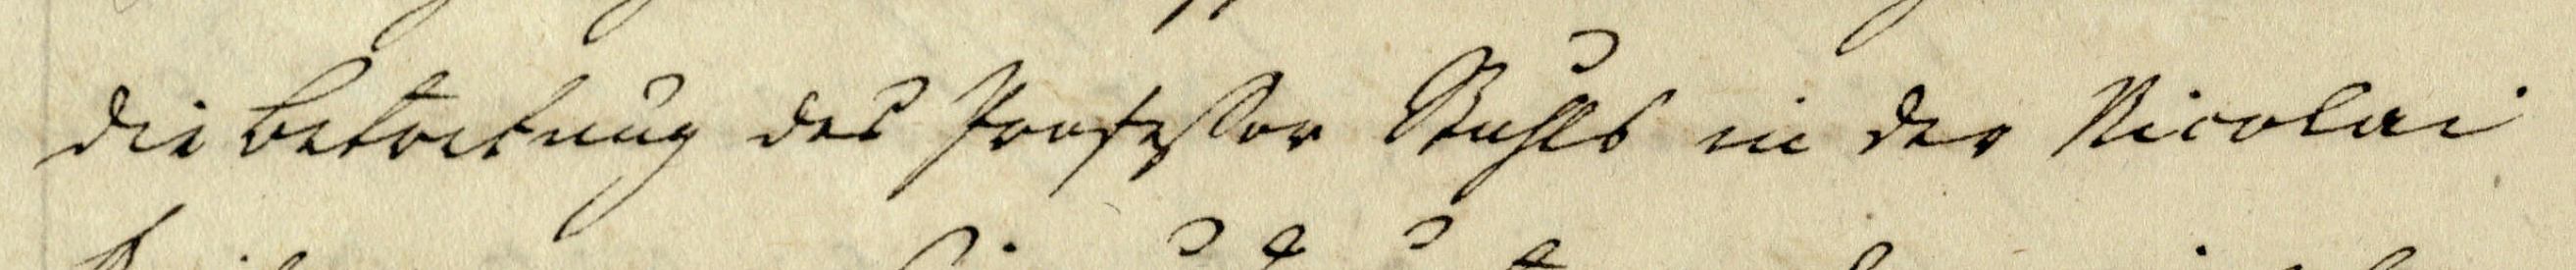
die Betretung des Professor Stuhls in der Nicolai
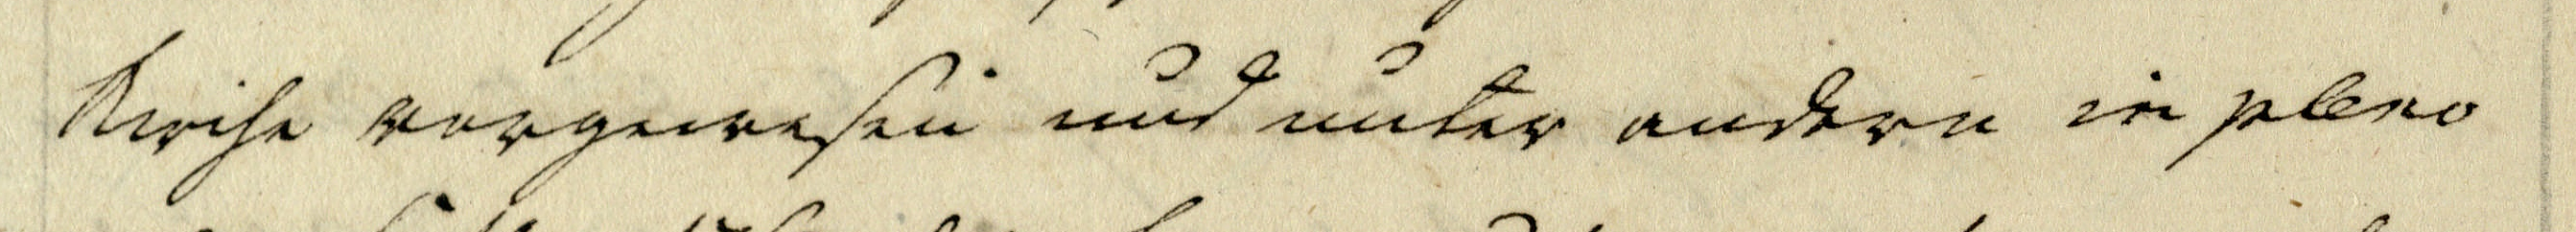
Kirche vorgewesen und unter andern in pleno
